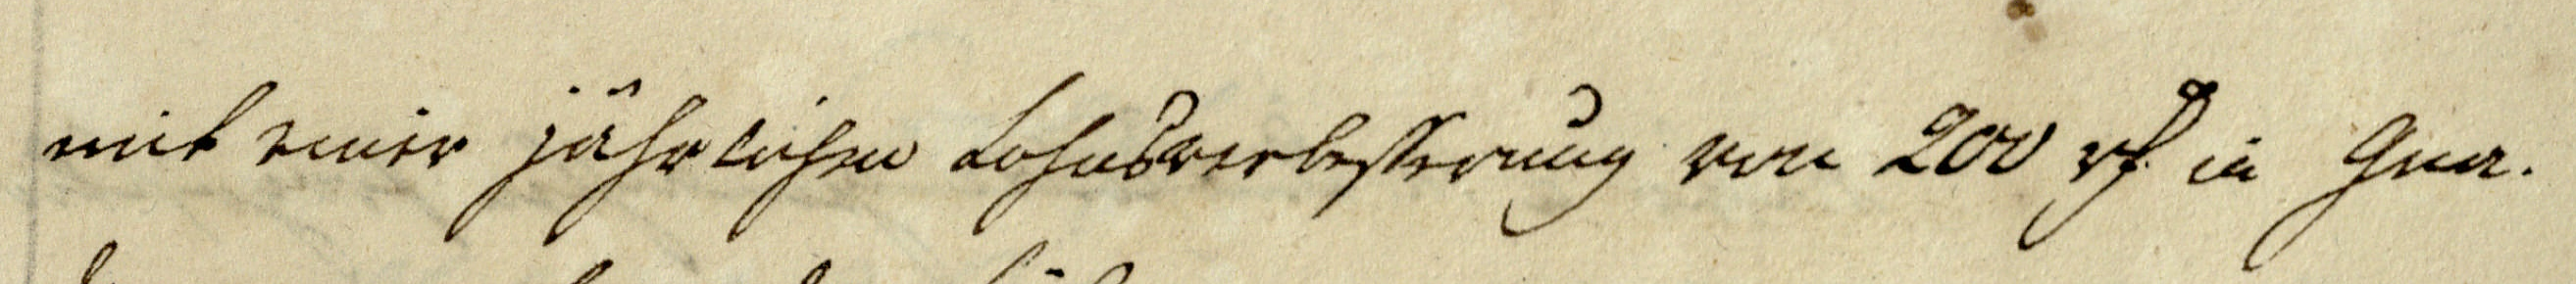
mit einer jährlichen Lohnsverbesserung von 200 rt. in Gna¬
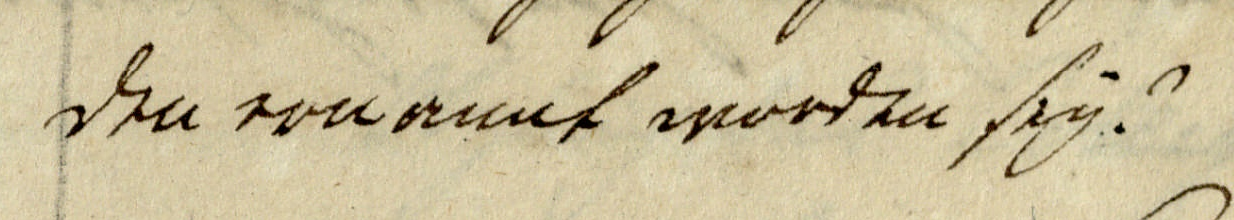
den ernannt worden seÿ?
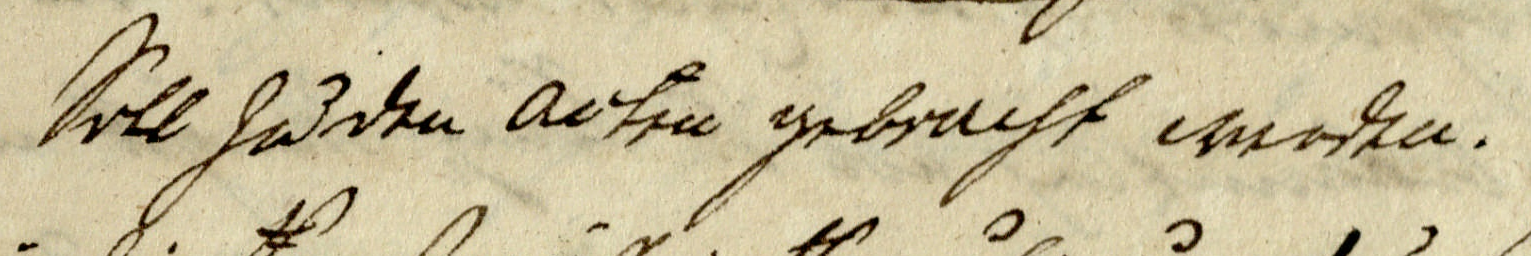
Soll zu den Acten gebracht werden.
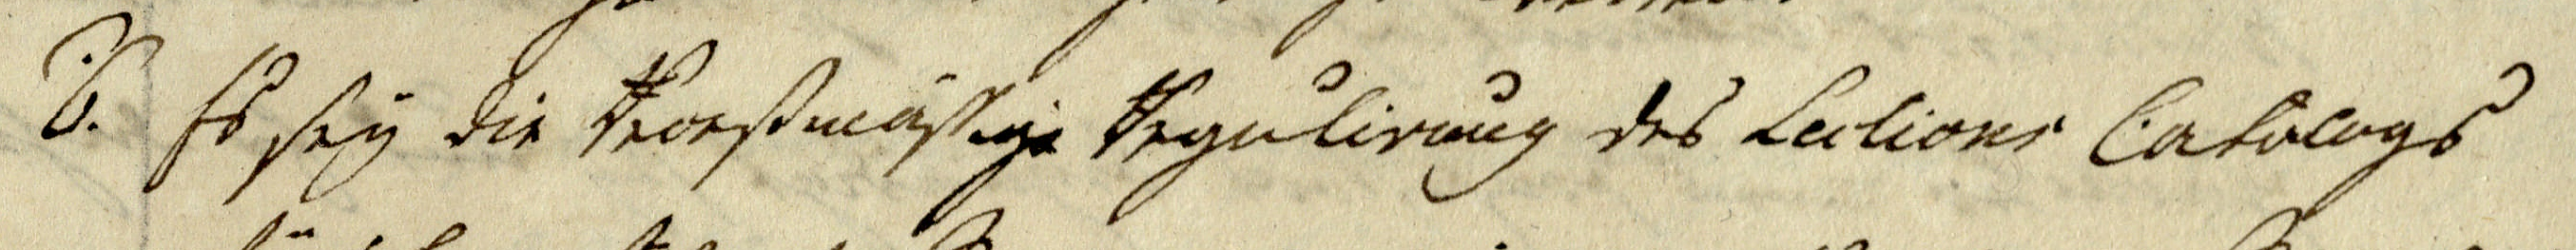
6. Es seÿ die Receßmässige Regulirung des Lections Catalogs
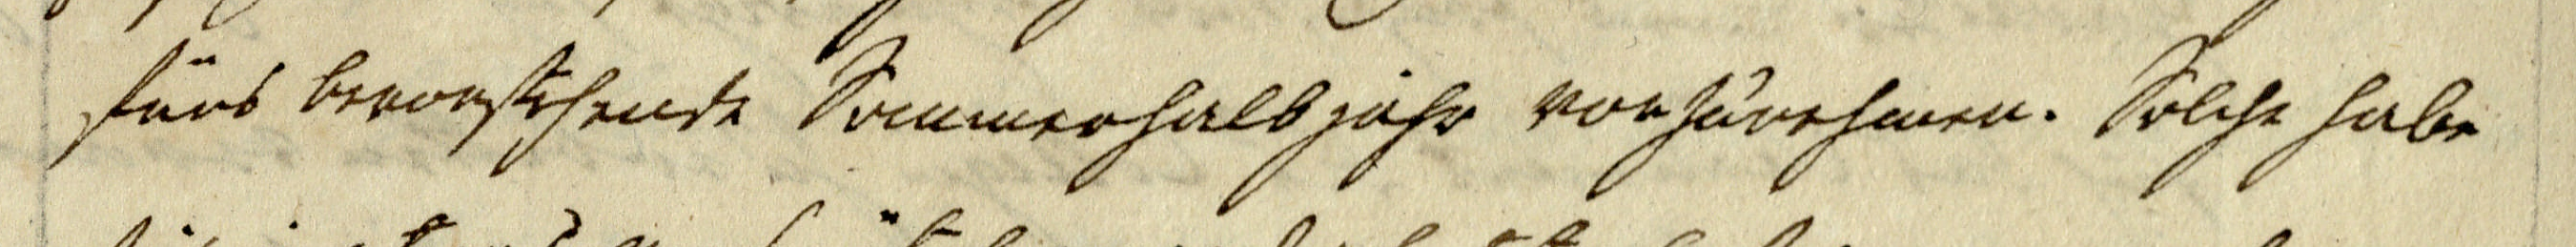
fürs bevorstehende Sommerhalbjahr vorzunehmen. Solche habe
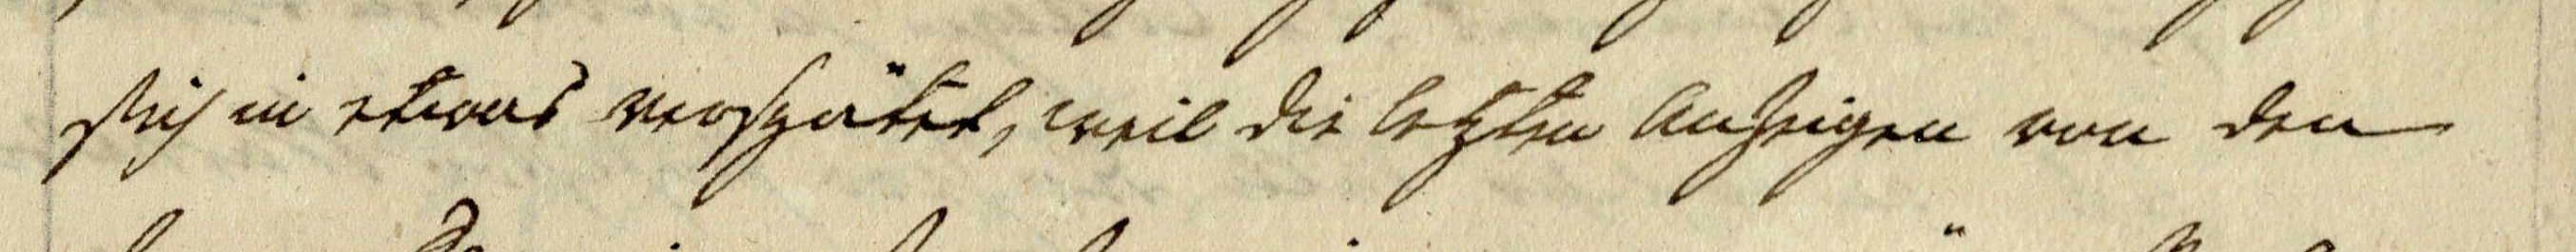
sich in etwas verspätet, weil die letzten Anzeigen von den
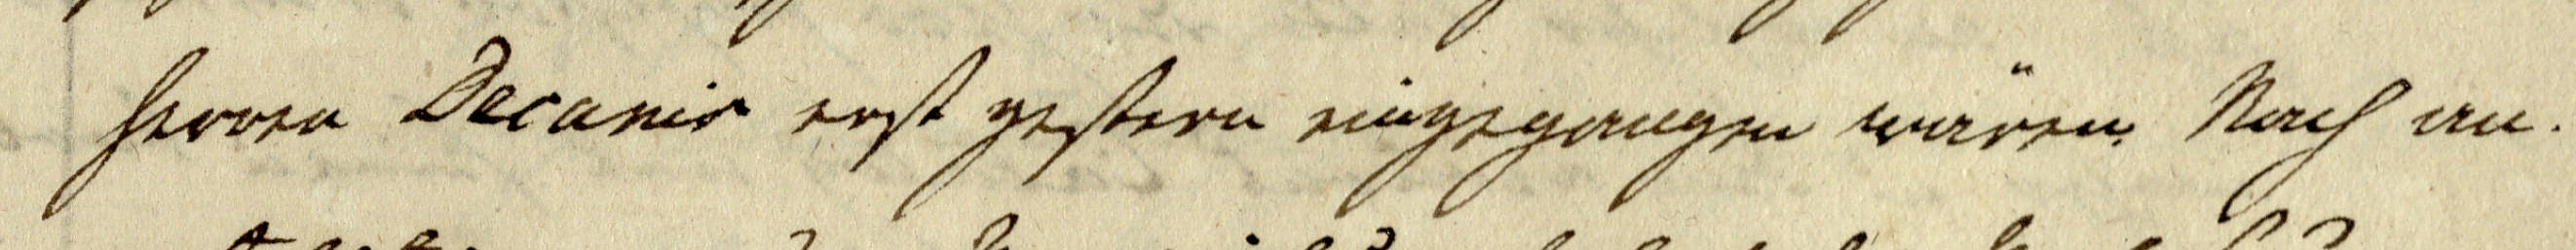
Herren Decanis erst gestern eingegangen wären. Nach an¬
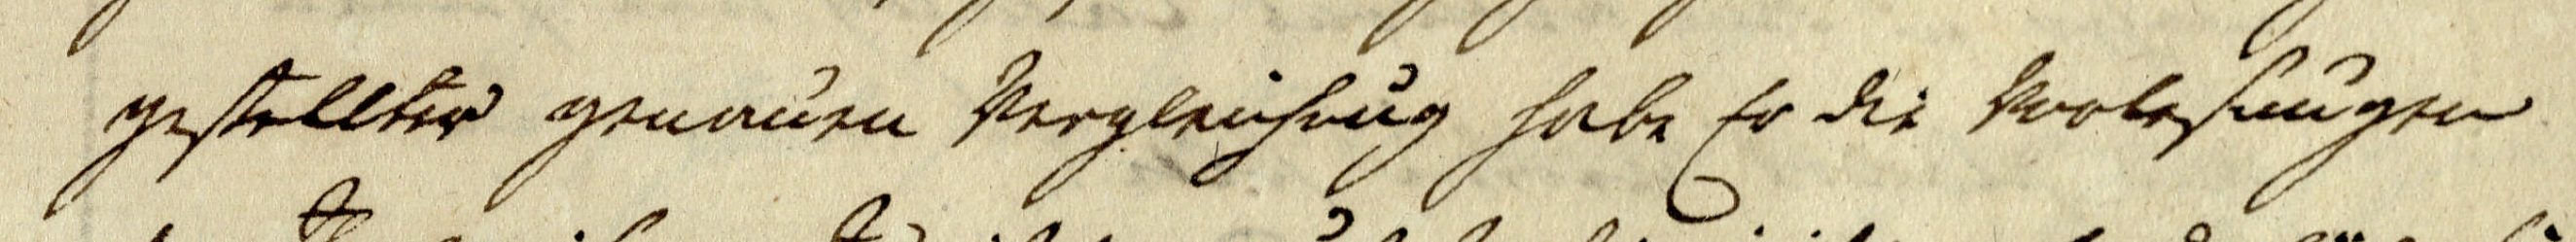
gestellter genauen Vergleichung habe Er die Vorlesungen
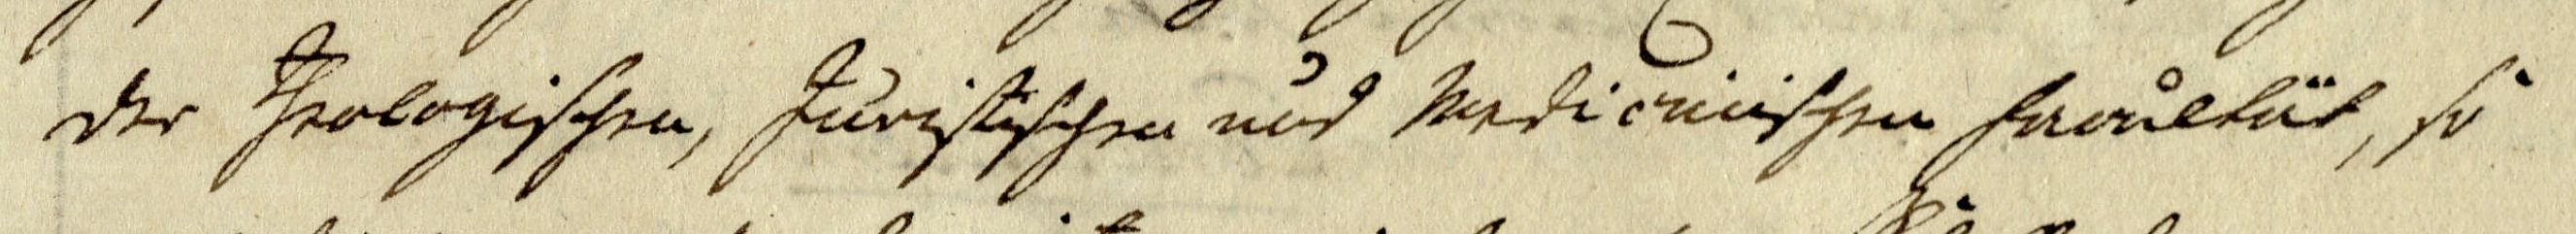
der Theologischen, Juristischen und Medicinischen Facultät, so
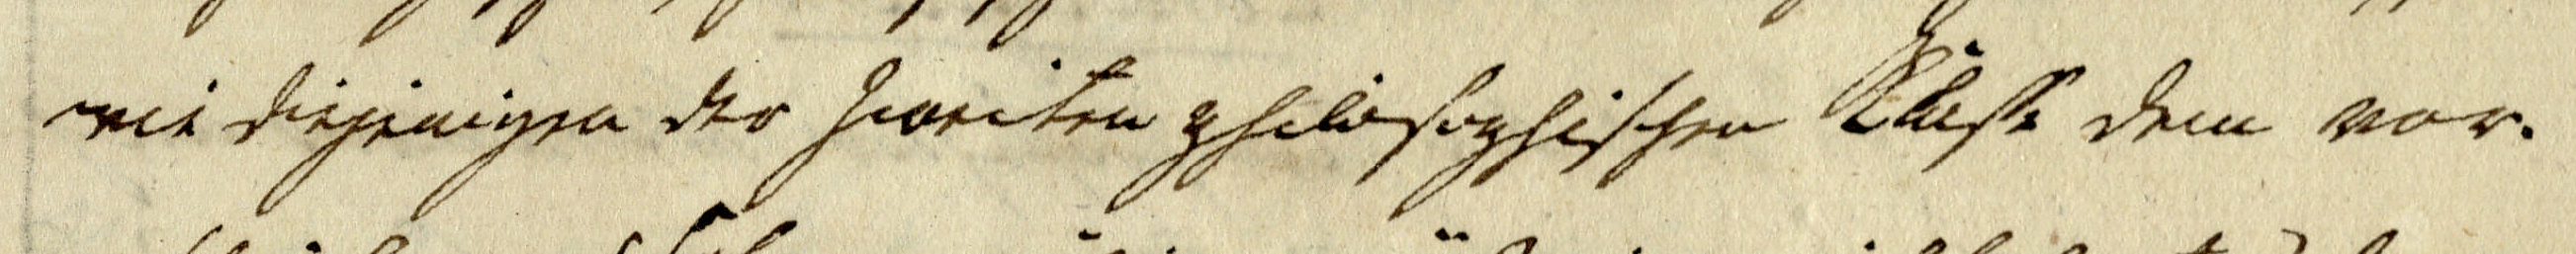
wie diejenigen der zweiten philosophischen Klasse dem vor¬
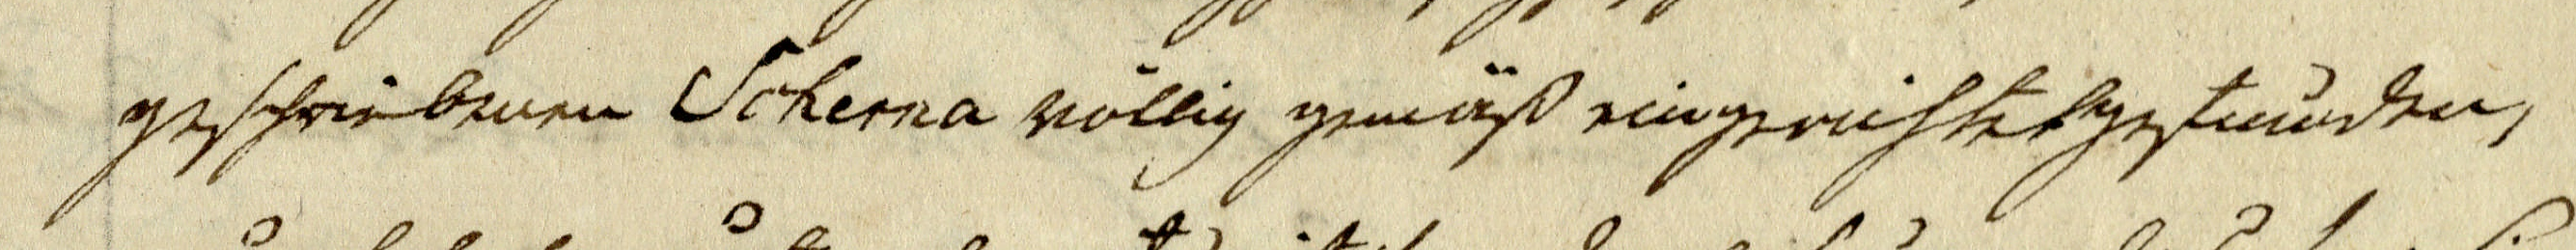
geschriebenen Schema völlig gemäß eingerichtetgefunden,
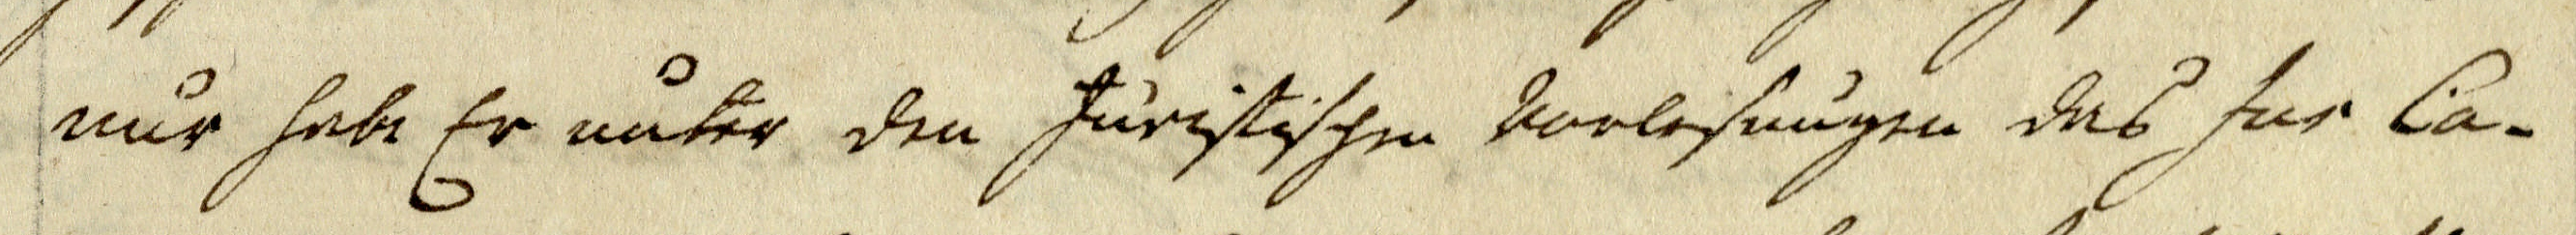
nur habe Er unter den Juristischen Vorlesungen das Jus Ca¬
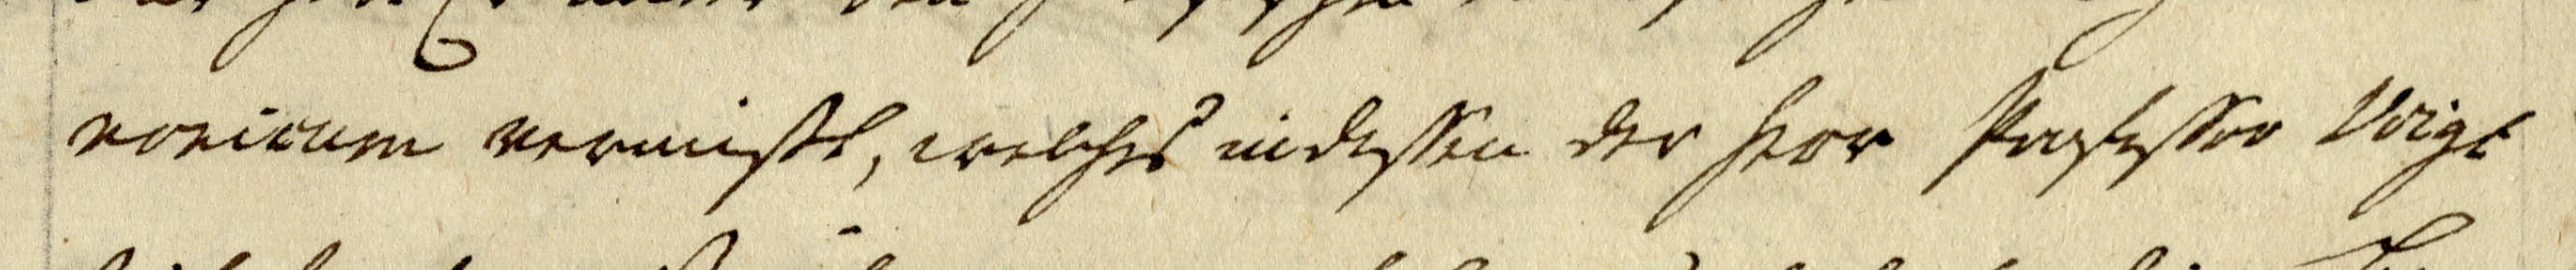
nonicum vermißt, welches indessen der Herr Professor Voigt
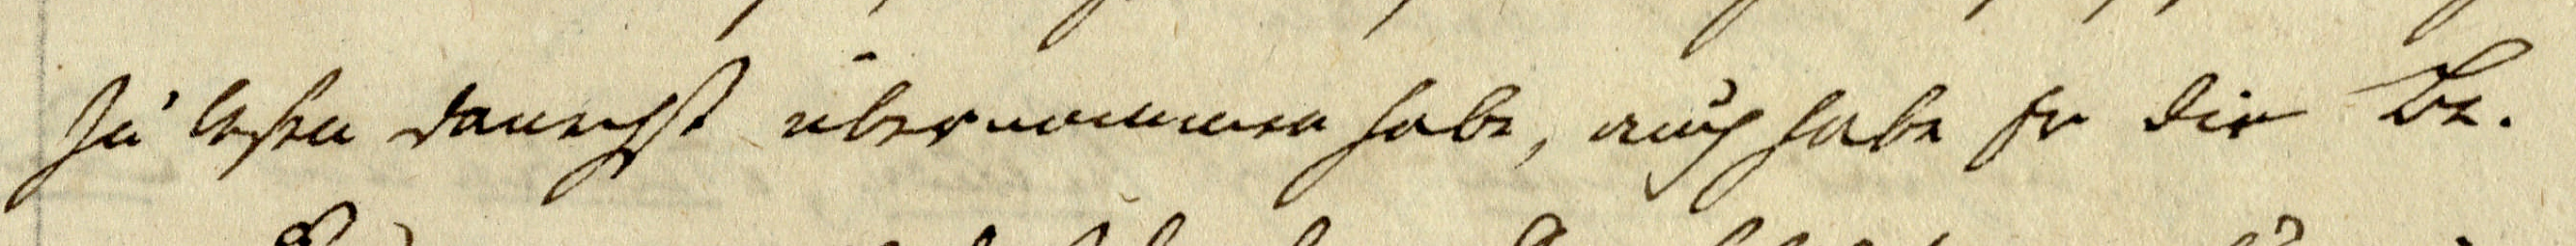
zu lesen danechst übernommen habe, auch habe Er die Be¬
